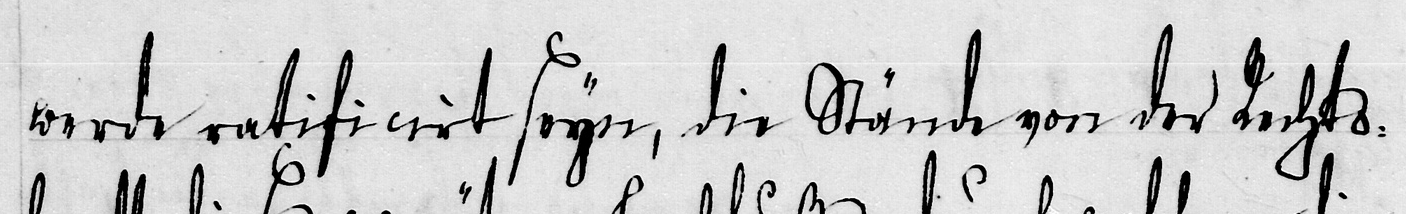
werde ratificirt seyn, die Stände von der Rechts¬
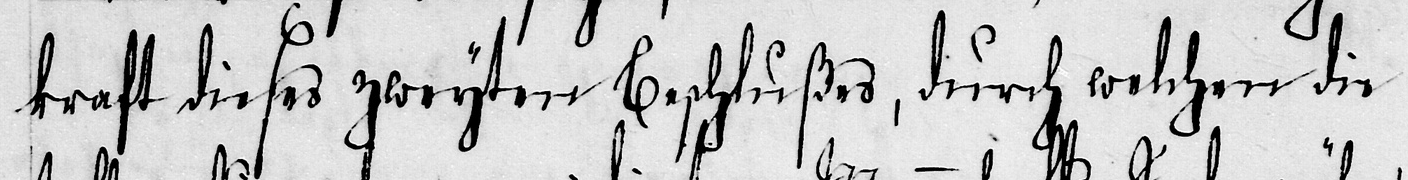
kraft dieses zweyten Beschlußes, durch welchen die
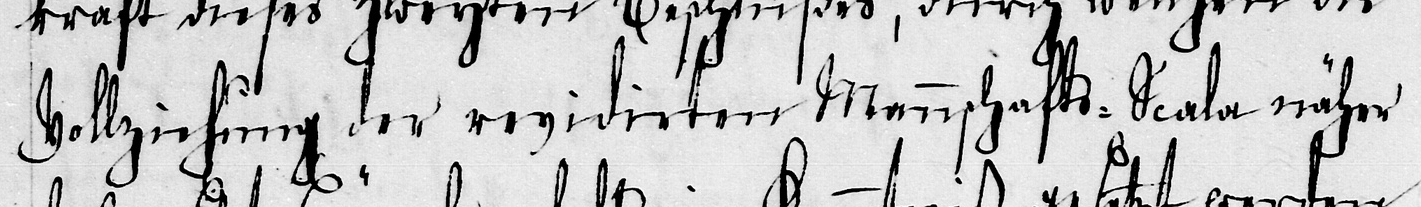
Vollziehung der revidirten Mannschafts-Scala näher
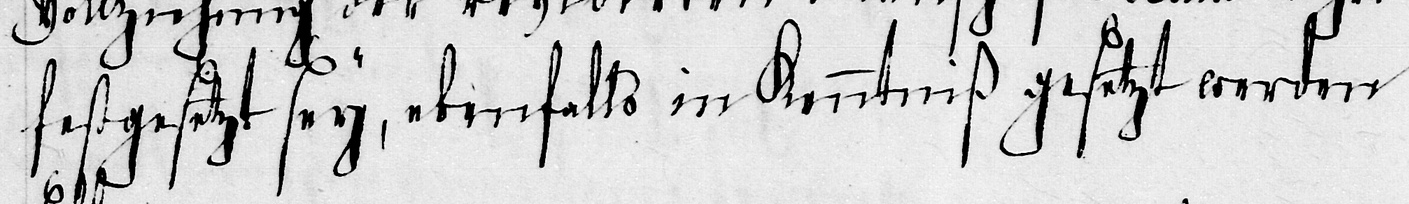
festgesetzt sey, ebenfalls in Kenntniß gesetzt werden
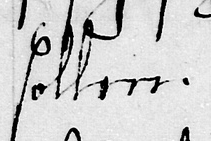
sollen.
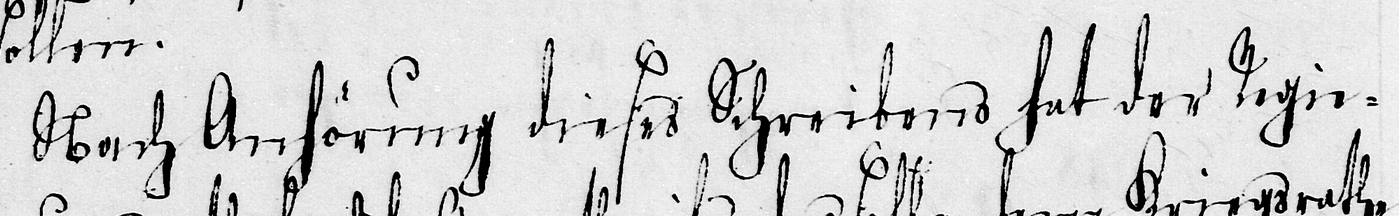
Nach Anhörung dieses Schreibens hat der Regie¬
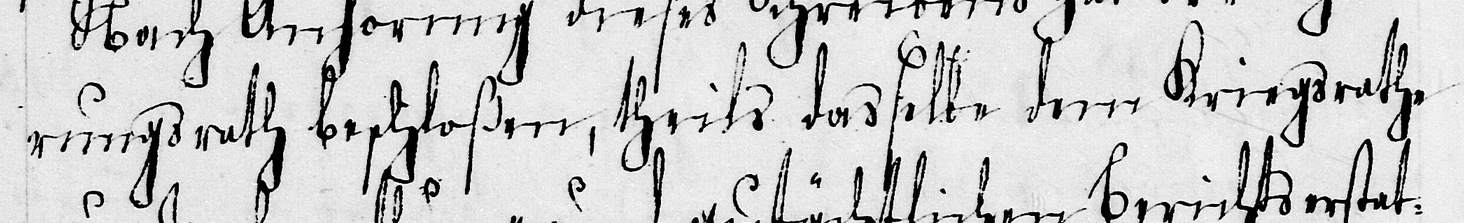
rungsrath beschloßen, theils dasselbe dem Kriegsrathe
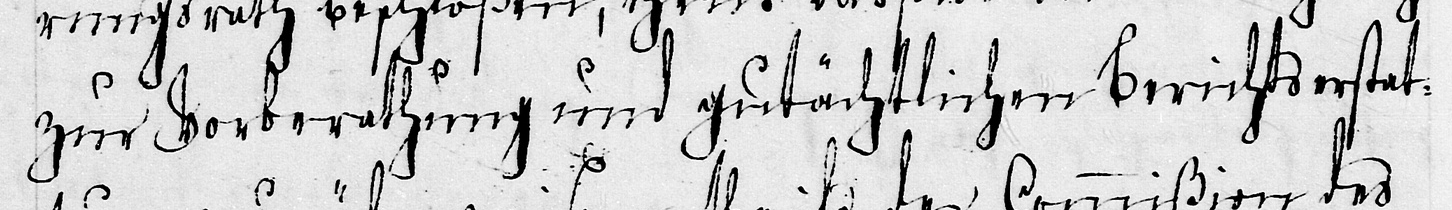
zur Vorberathung und gutächtlichen Berichtserstat¬
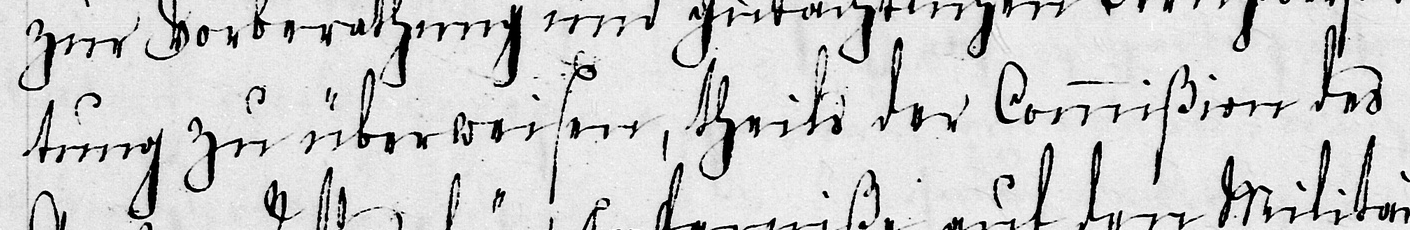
tung zu überweisen, theils der Commißion des
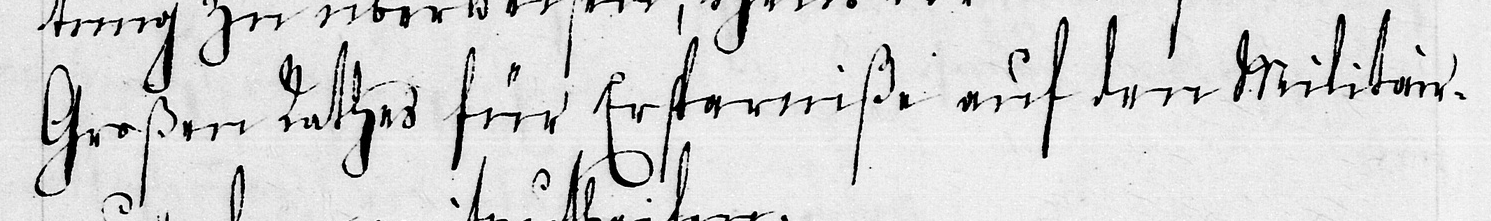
Großen Rathes für Ersparniße auf den Militair¬
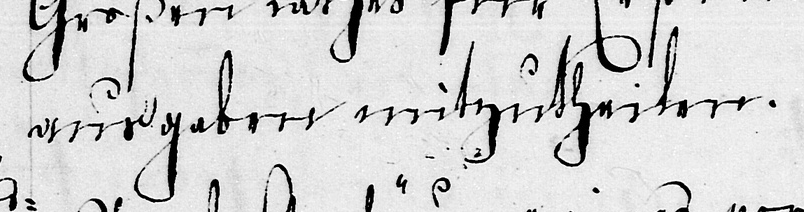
ausgaben mitzutheilen.
